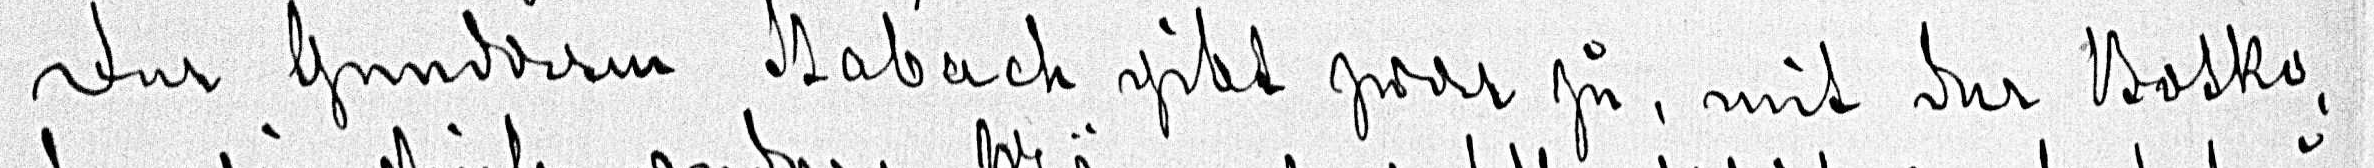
Der Gendarm Stabach gibt zwar zu, mit der Botko
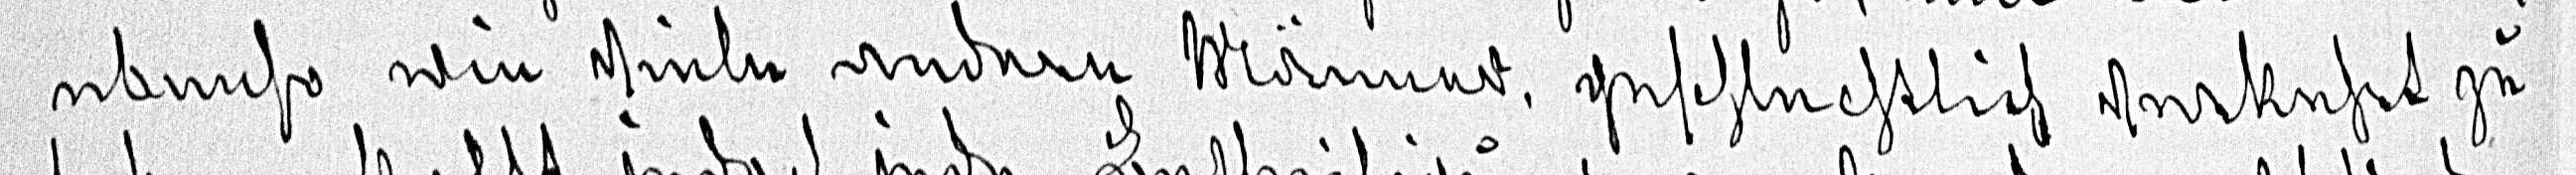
ebenso wie viele andere Männer, geschlechtlich verkehrt zu
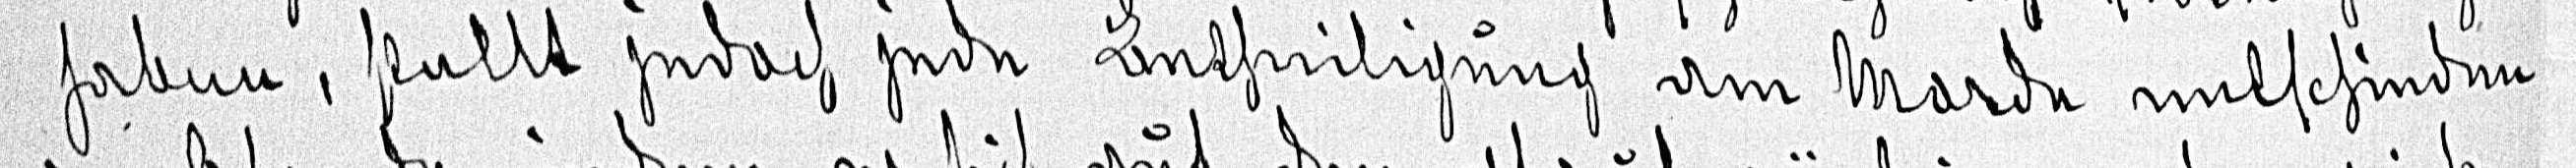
haben, stellt jedoch jede Betheiligung am Morde entschieden
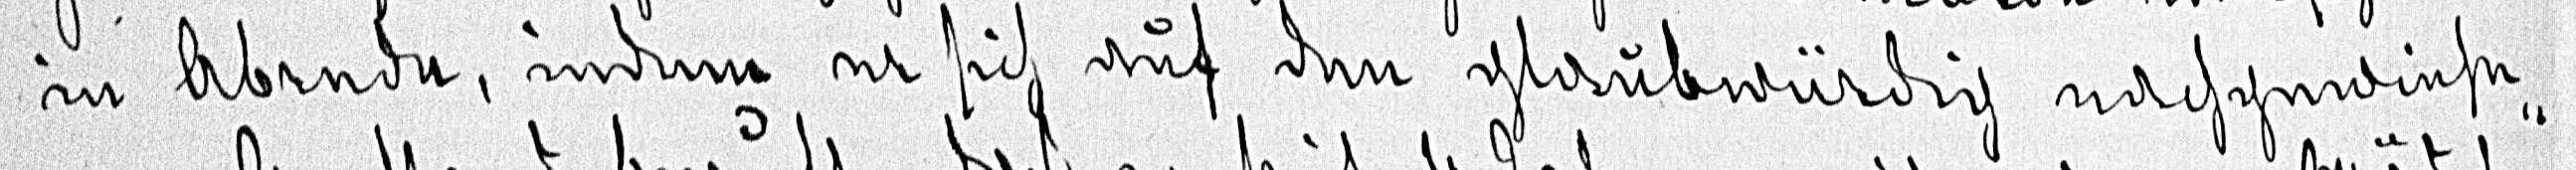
in Abrede, indem er sich auf den glaubwürdig nachgewiese¬
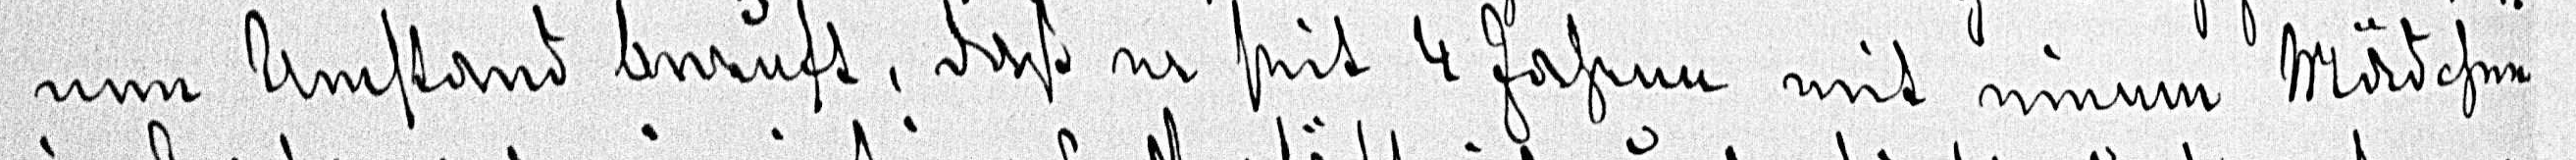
nen Umstand beruft, daß er seit 4 Jahren mit einem Mädchen
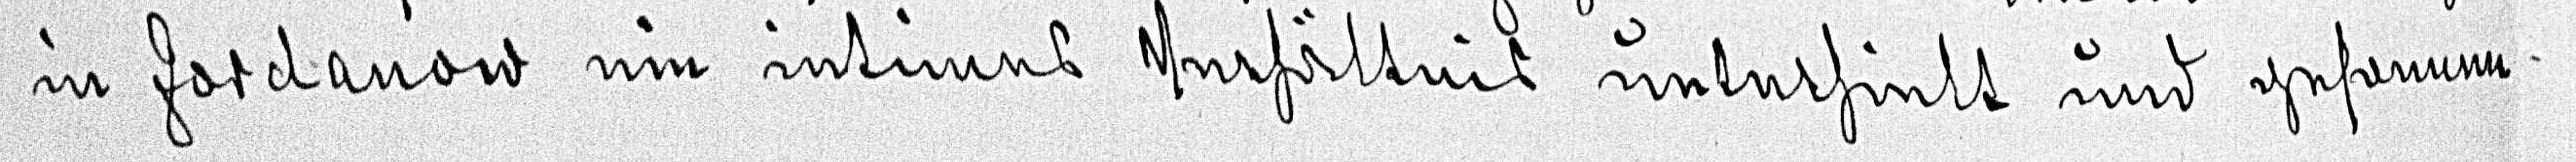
in Zordanow ein intimes Verhältnis unterhielt und gesonnen
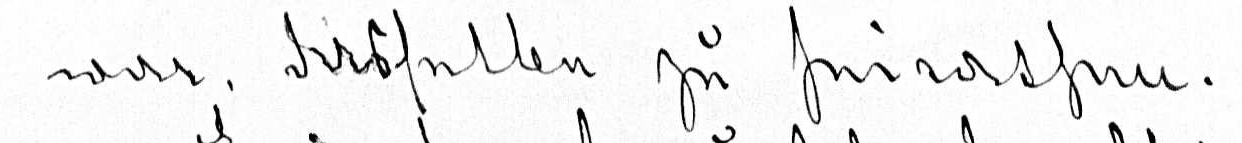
war, dieselbe zu heirathen.
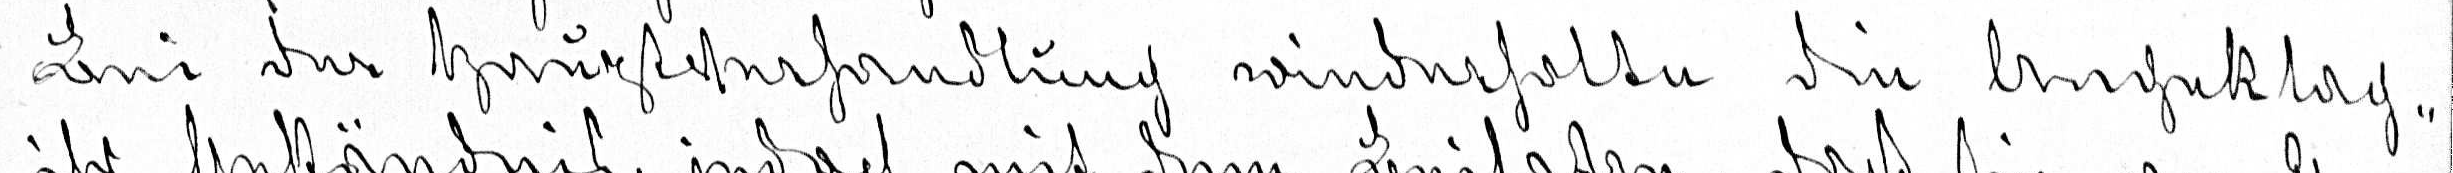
Bei der Hauptverhadlung wiederholte die Angeklag¬
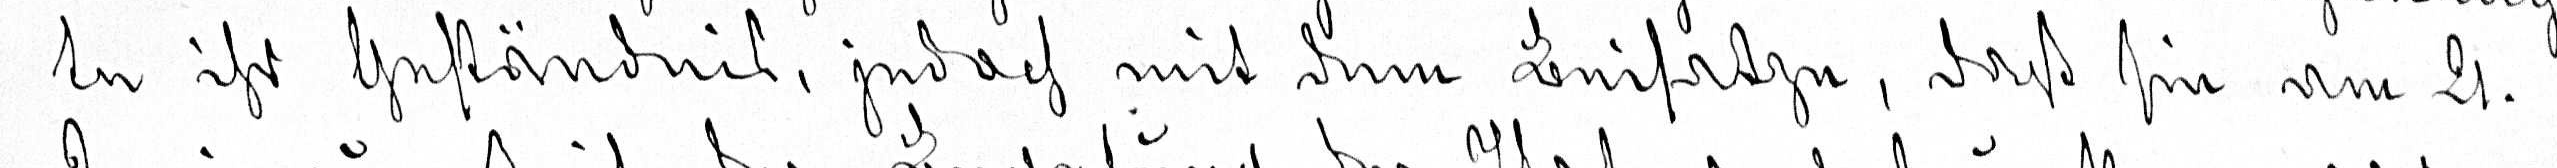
te ihr Geständnis, jedoch mit dem Beisetze, daß sie am 21.
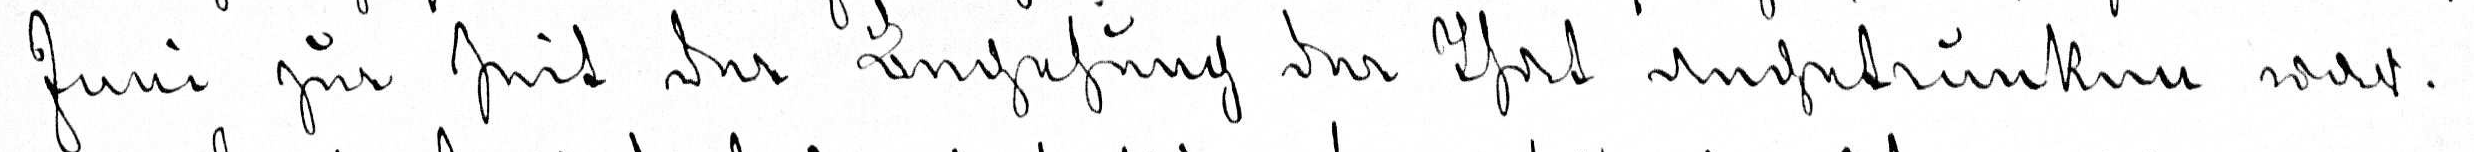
Juni zur Zeit der Begehung der That angetrunken war.
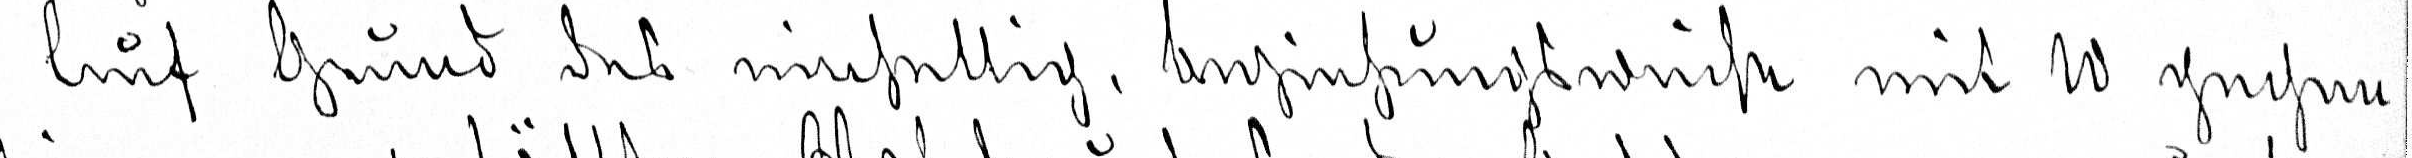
Auf Grund des einhellig, beziehungsweise mit 10 gegen
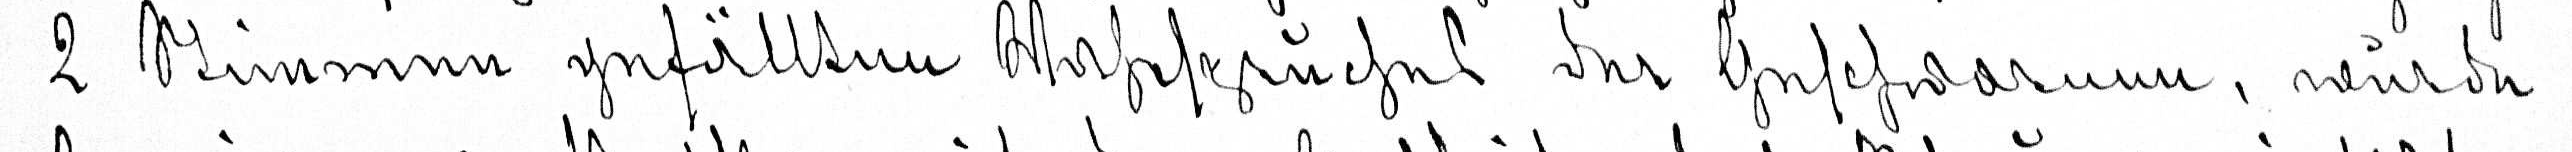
2 Stimmen gefällten Wahrspruches der Geschworenen, wurde
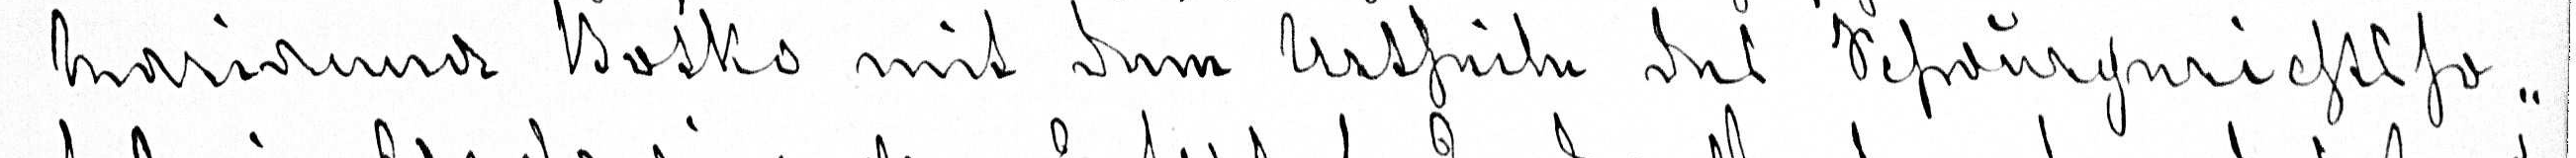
Marianna Botko mit dem Urtheile des Schwurgerichtsho¬
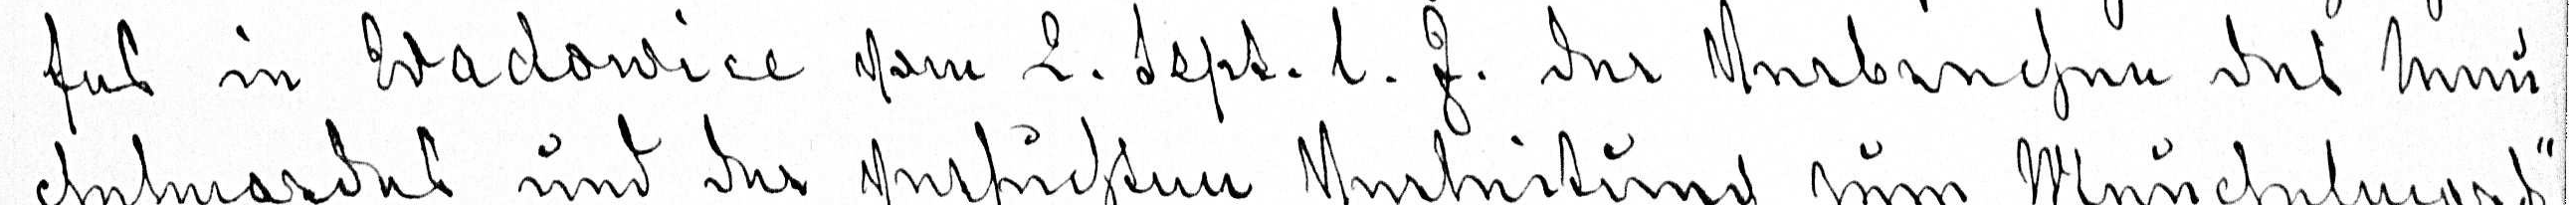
fes in Wadowice vom 2. Sept. l. J. des Verbrechen des Meu¬
